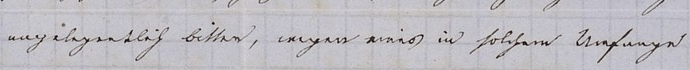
angelegentlich bitten, wegen eines in solchem Umfange
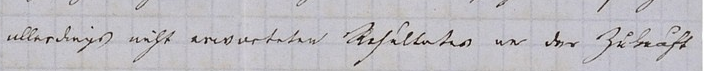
allerdings nicht erwarteten Resultates an der Zukunft
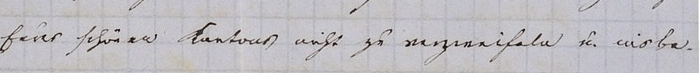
Eures schönen Kantons nicht zu verzweifeln u. insbe-
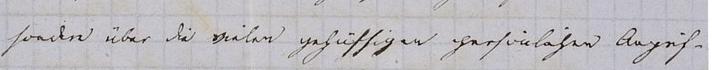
sondre über die vielen gehässigen persönlichen Angrif-
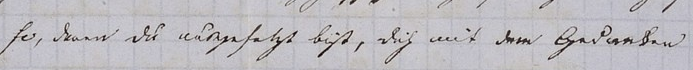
fen, denen Du ausgesetzt bist, Dich mit dem Gedanken
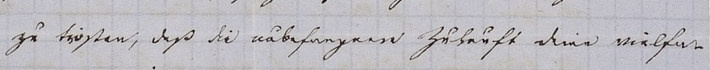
zu trösten, daß die unbefangnere Zukunft Deine vielfa-
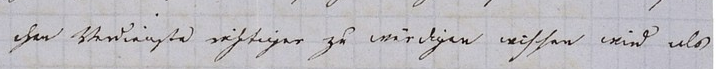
chen Verdienste richtiger zu würdigen wissen wird als
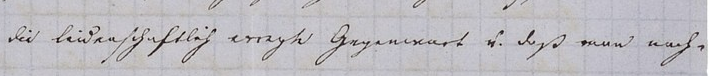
die leidenschaftlich erregte Gegenwart u. daß man nach-
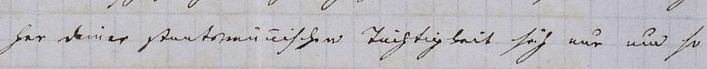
her Deiner staatsmännischen Tüchtigkeit sich nur um so
